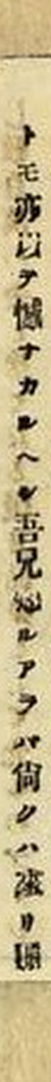トモ亦以テ憾ナカルヘシ我が兄知ルアラバ尚クハ來リ

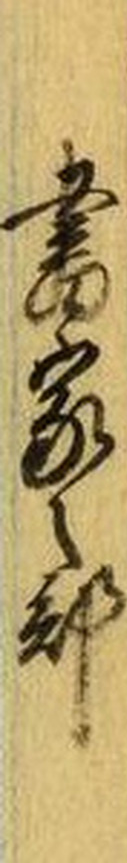書家之部
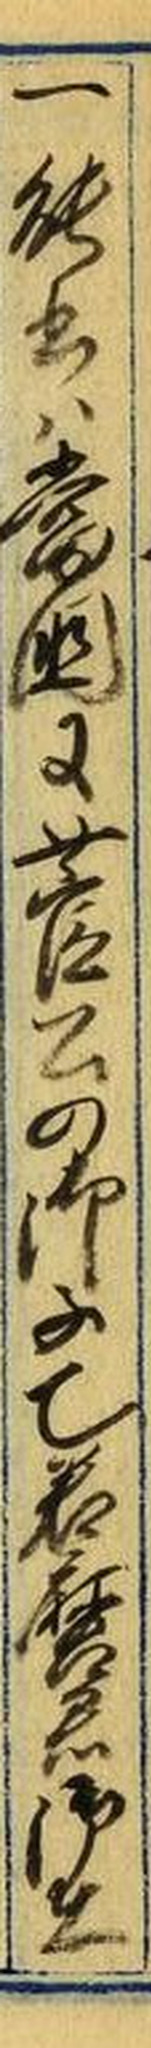一能書は当国に菅公の御子乙若麿君御在
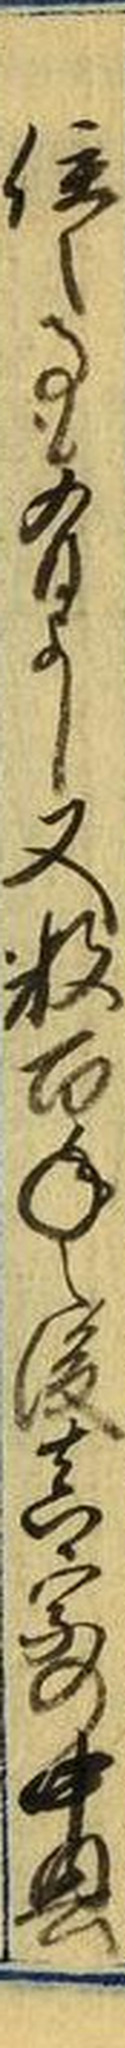住之事も有よし又数百年之後真宗の中興
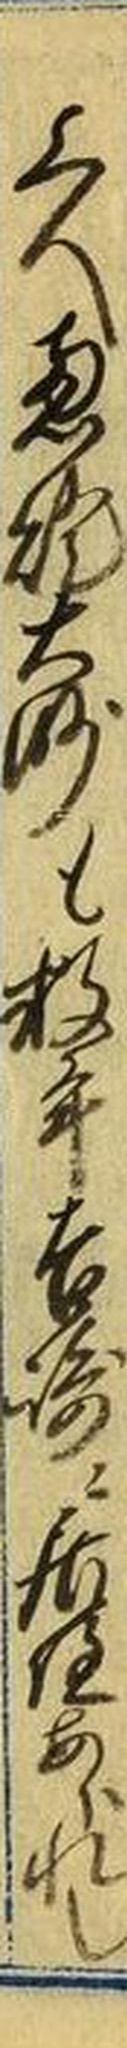上人恵燈大師も数年吉崎に居住あられし
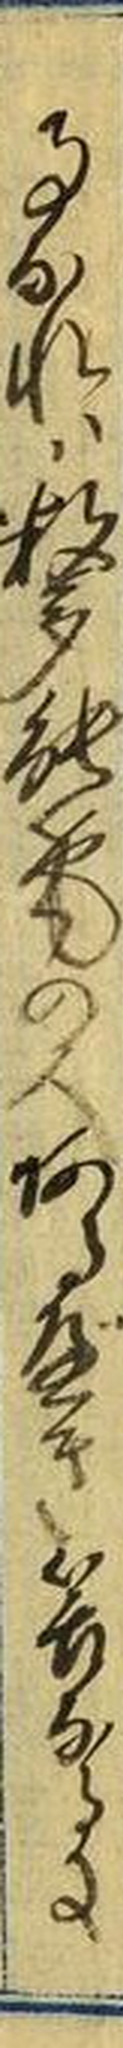事なれは数多能筆の人あるべき筈なるに
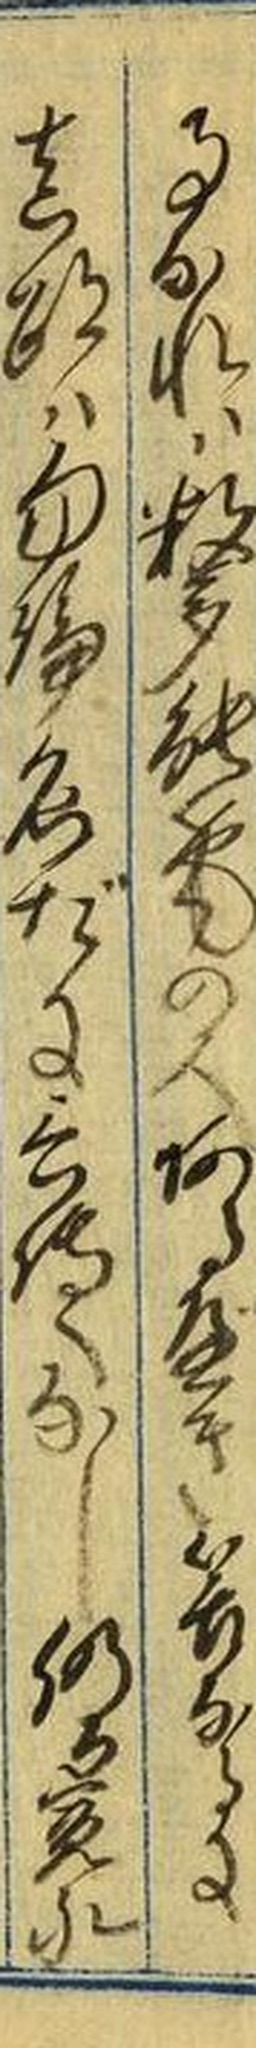真跡は勿論名だに言伝へなし仍而寛永
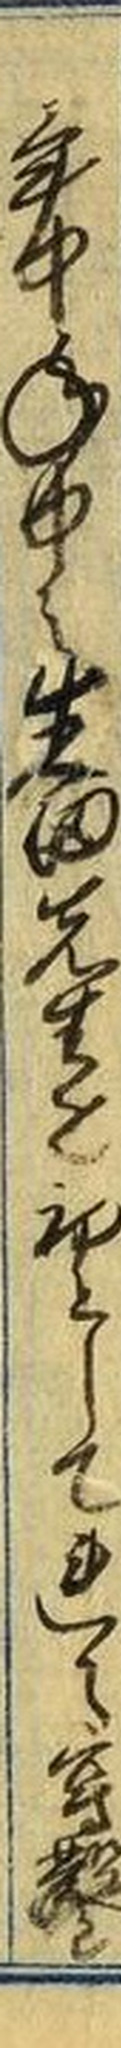年中年中之生田先生を初として連々穿鑿
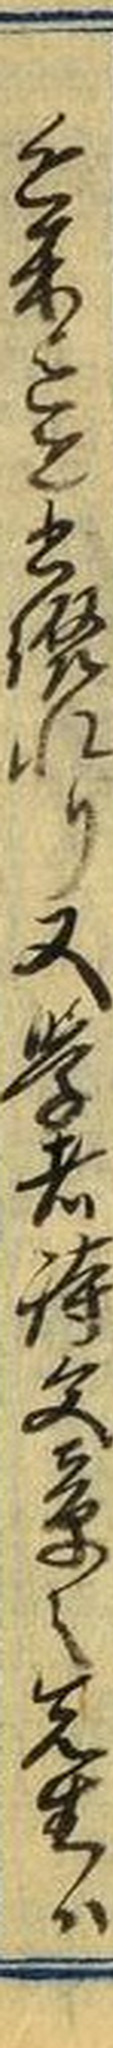近来迄を書綴れり又学者詩文章之先生は
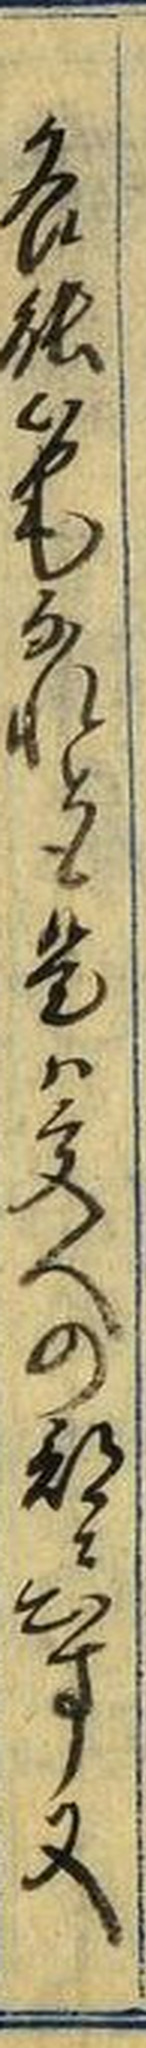各能筆なれとも是は文人の部に出す又
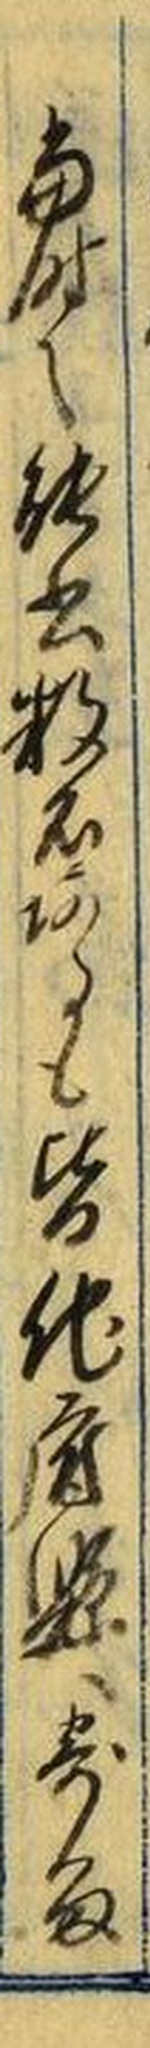当時之能書数名あるも皆他府県へ寄留

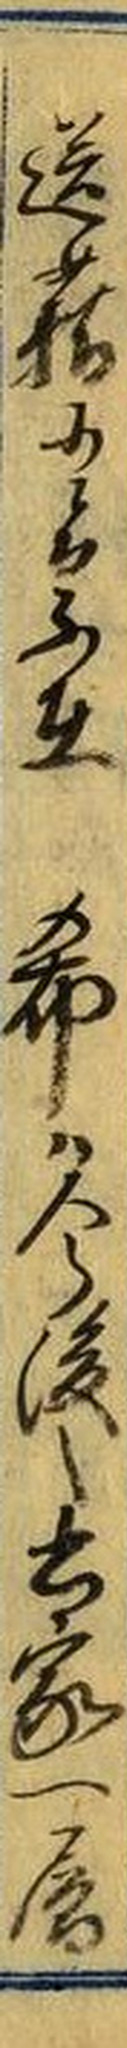送籍等に而不在希は今後之書家一層
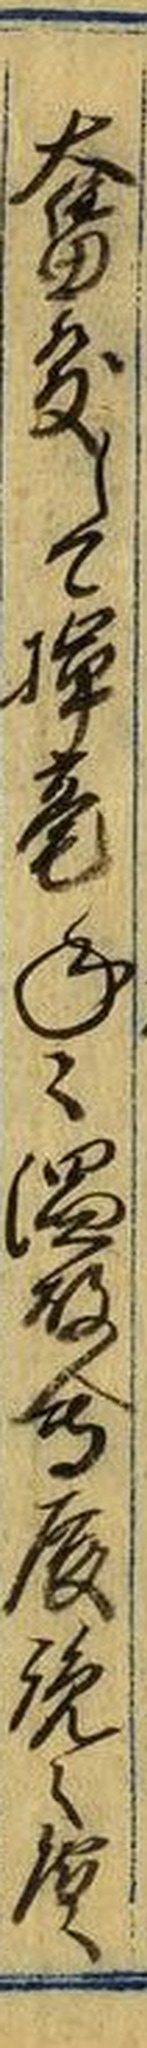奮発して揮毫年々温故会展覧之広
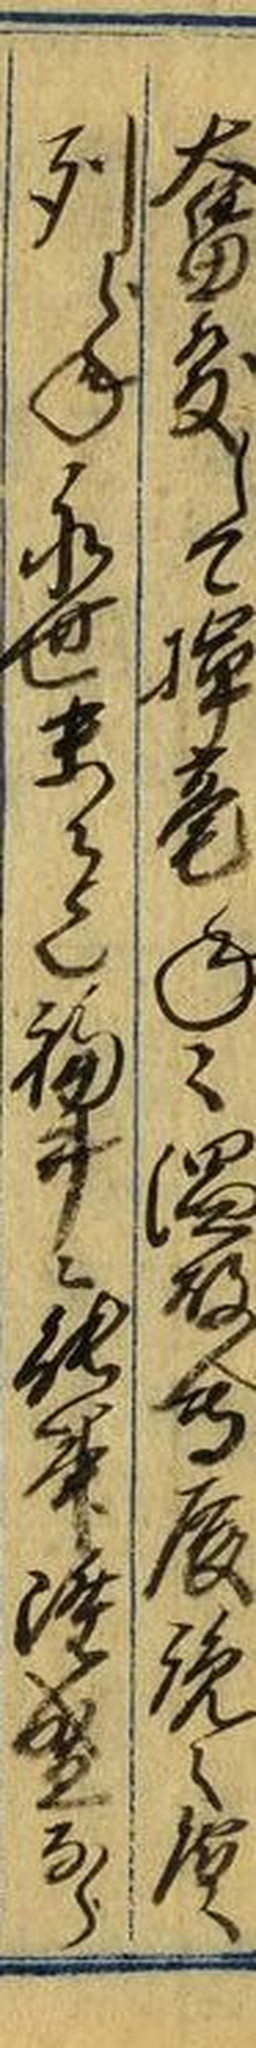列らね永世末々迄福井に能筆隆盛なら
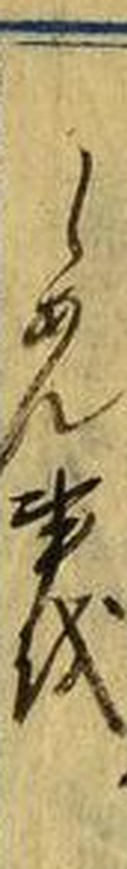しめん事を
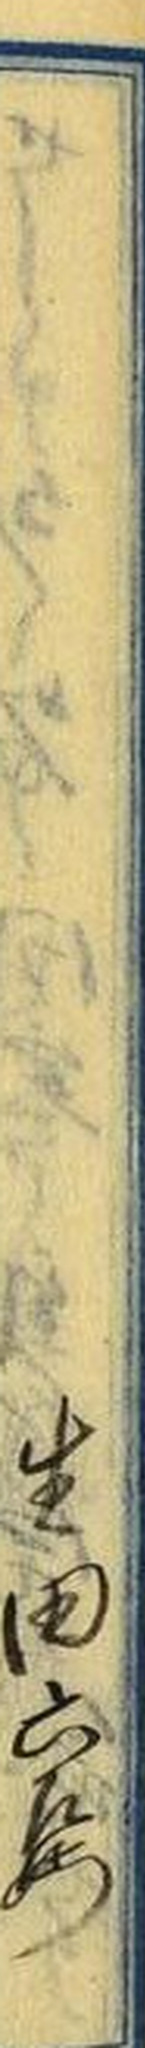生田六左衛門
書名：温古集 四巻
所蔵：福井県文書館 Fukui Prefectural Archives
